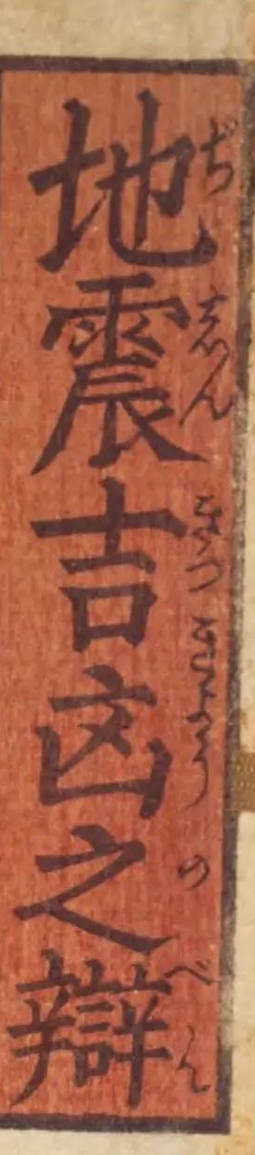地震吉凶之辯
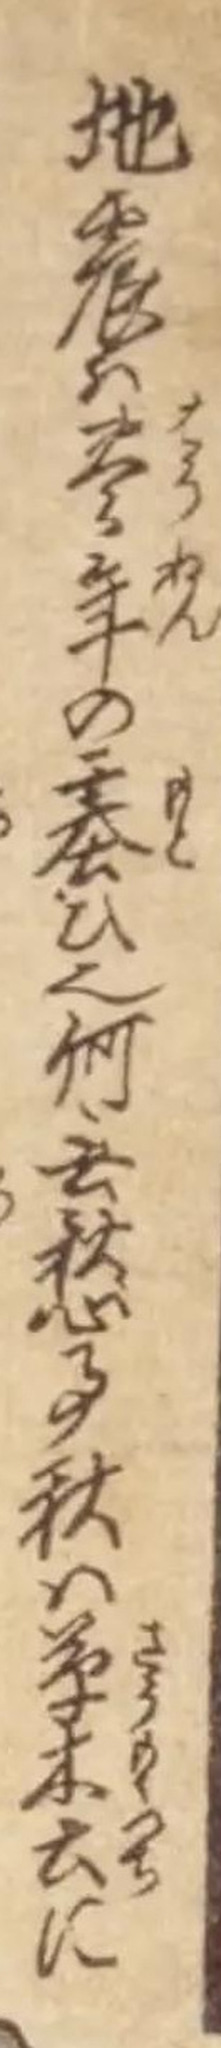地震は豊年の基ひ也何無愁事秋は草木土に
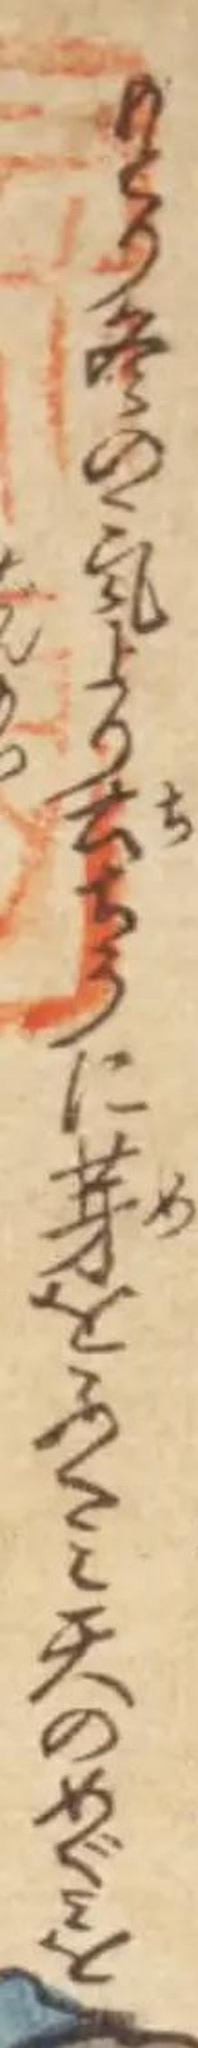もとり冬の気より土ちうに芽をふくみ天のめぐみを
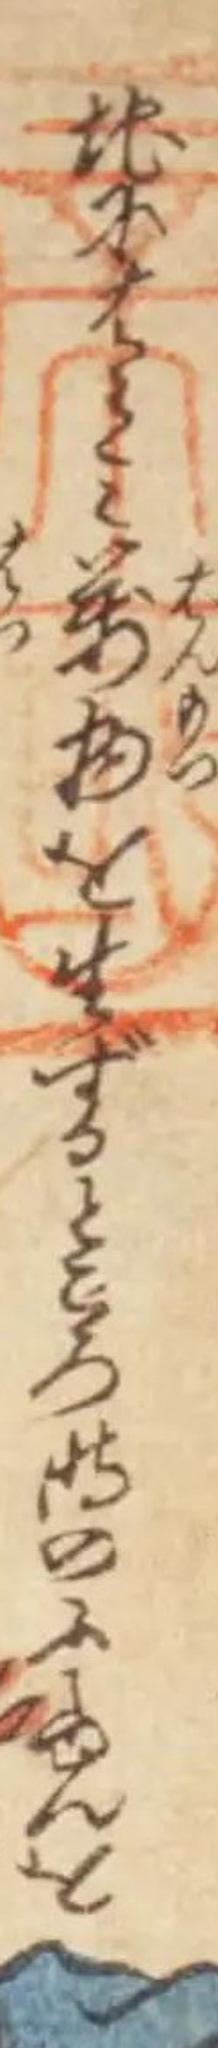地にはらみ万物を生ずるところ時のふしゆんを
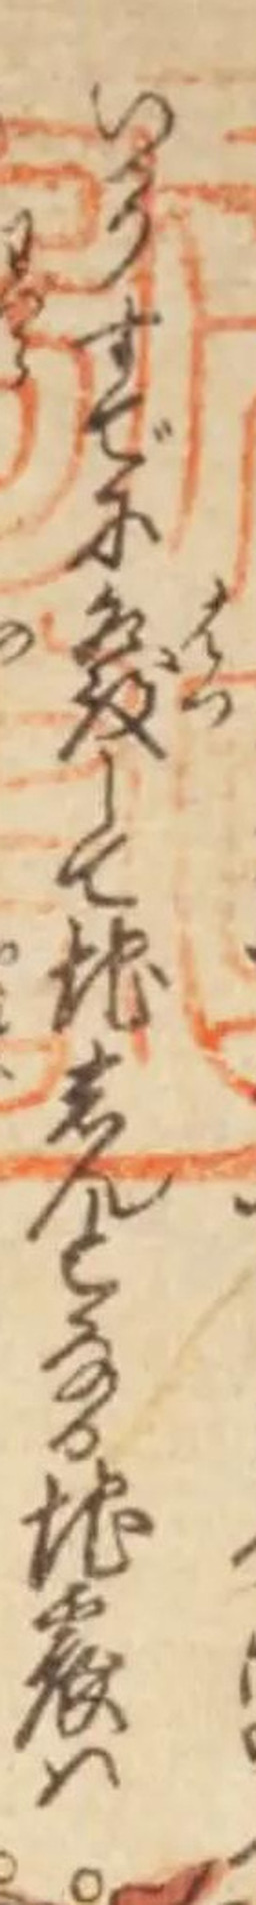いかりすでに發して地しんとなる地震は
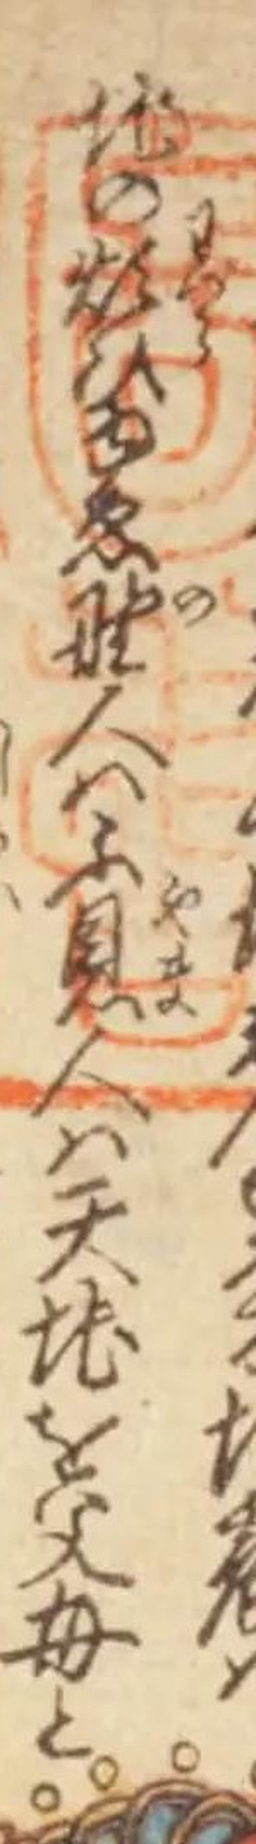地の煩ひゆゑ野人は不息人は天地を父母と
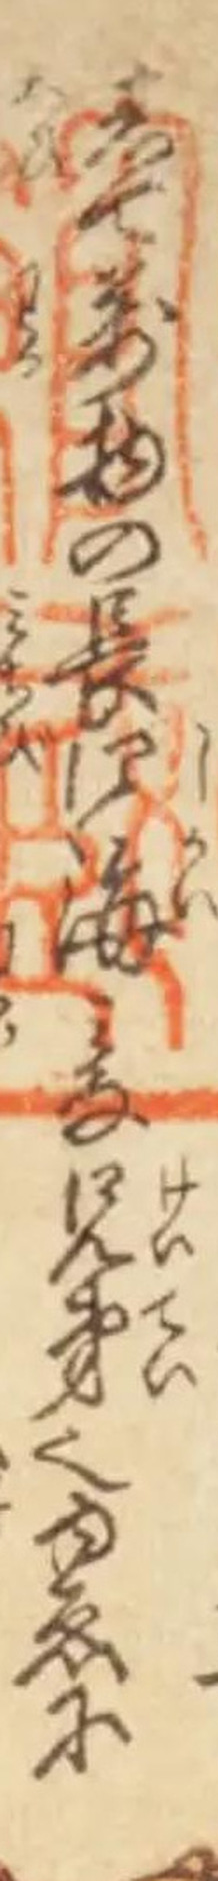して万物の長四海みな兄弟也ゆゑに
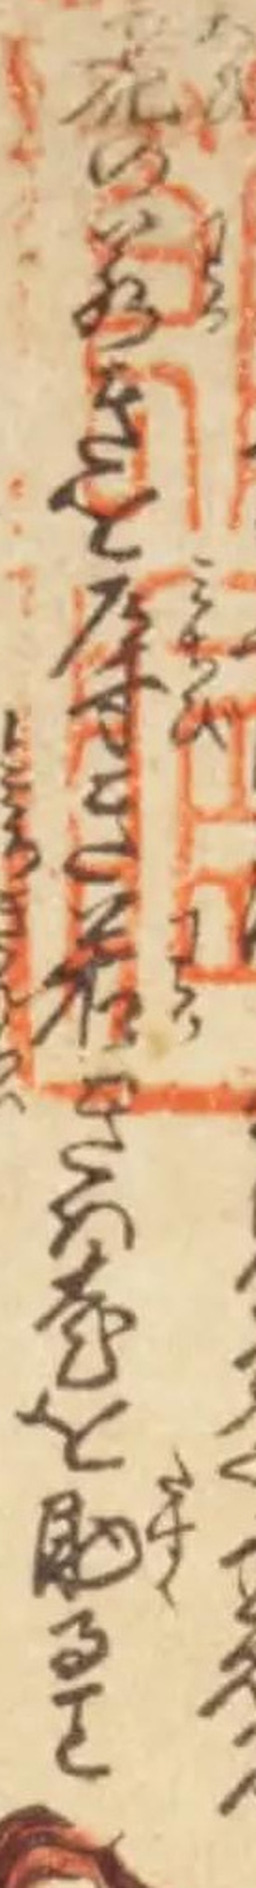老の若きを導き若きは老を助ること
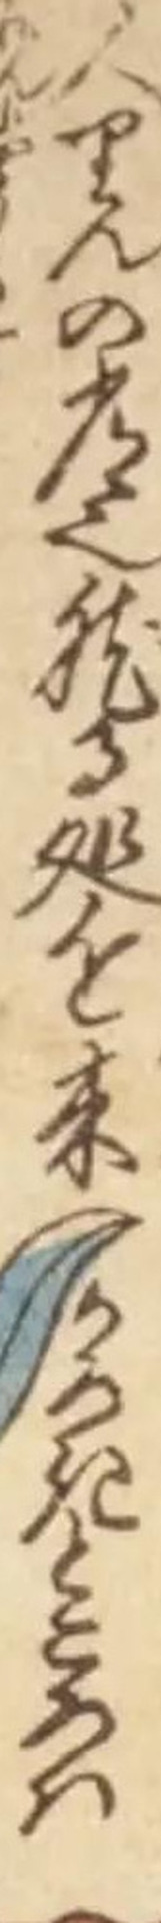人りんの常也然る処近来かろきところは
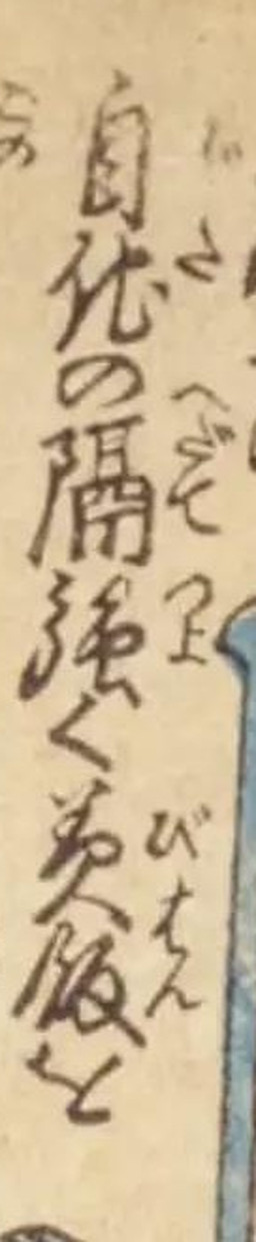自他の隔強く美飯を
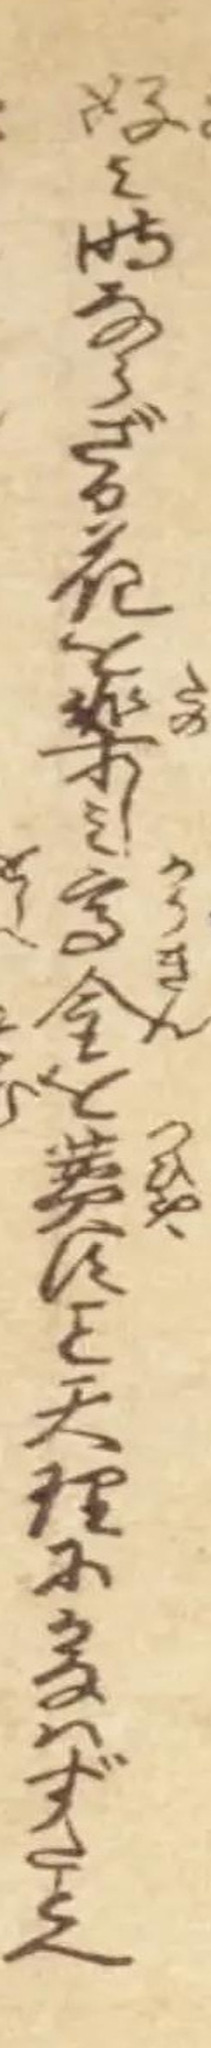好み時ならざる花を楽しみ高金を費すこと天理にかなはずたとへ
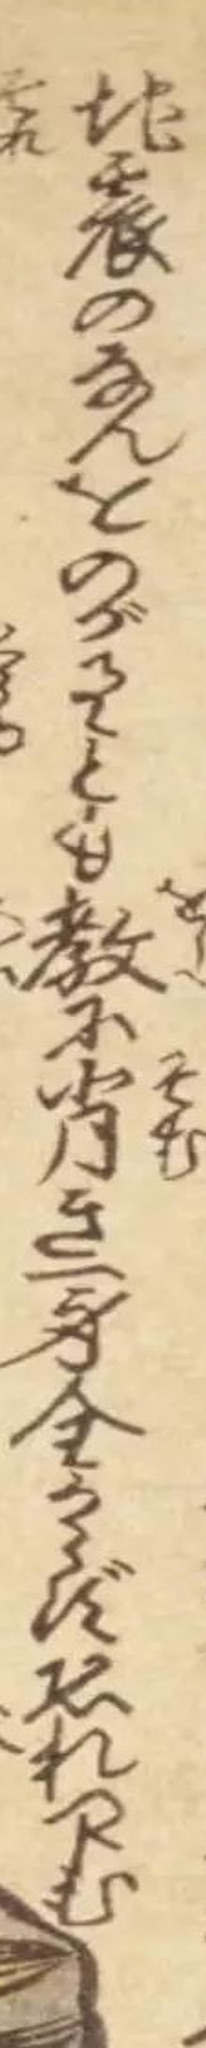地震のなんをのがるゝとも教に背き身全からず恐れつゝしむべし
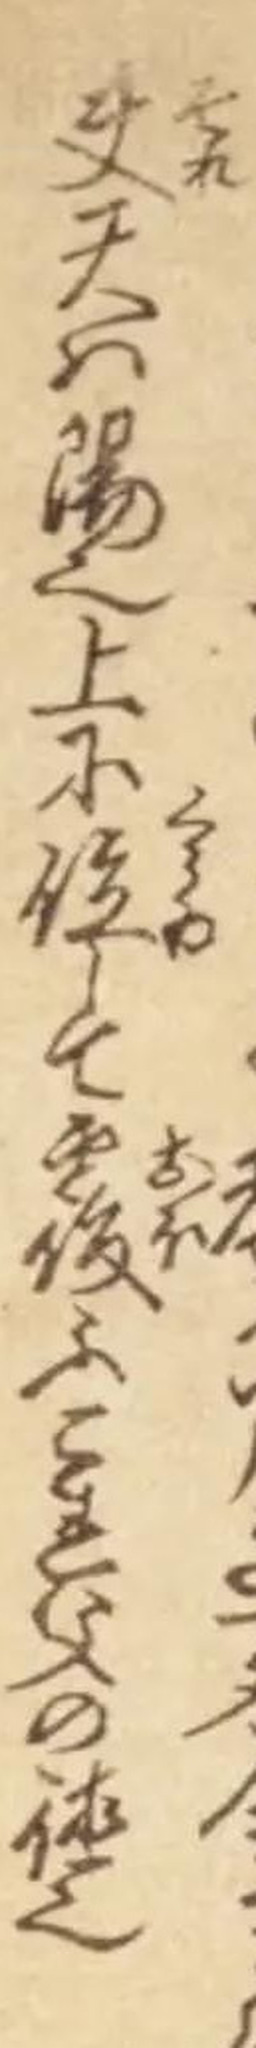夫天は陽也上に位して覆ふこれ父の徳也
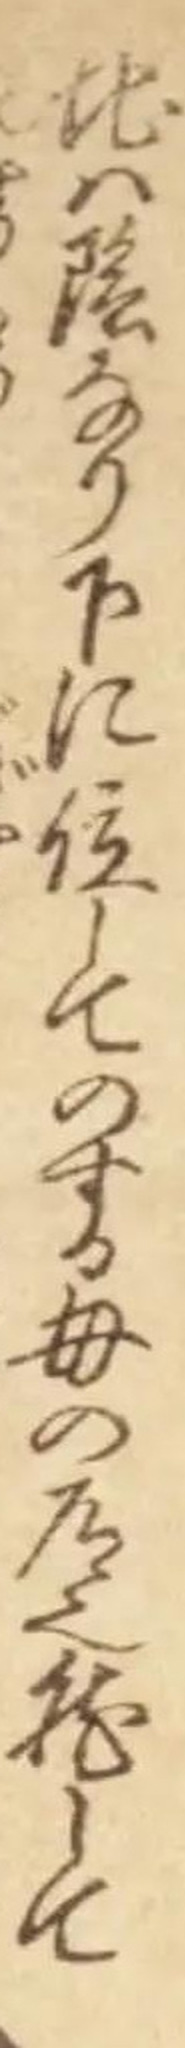地は陰なり下に位してのする母の道也然して
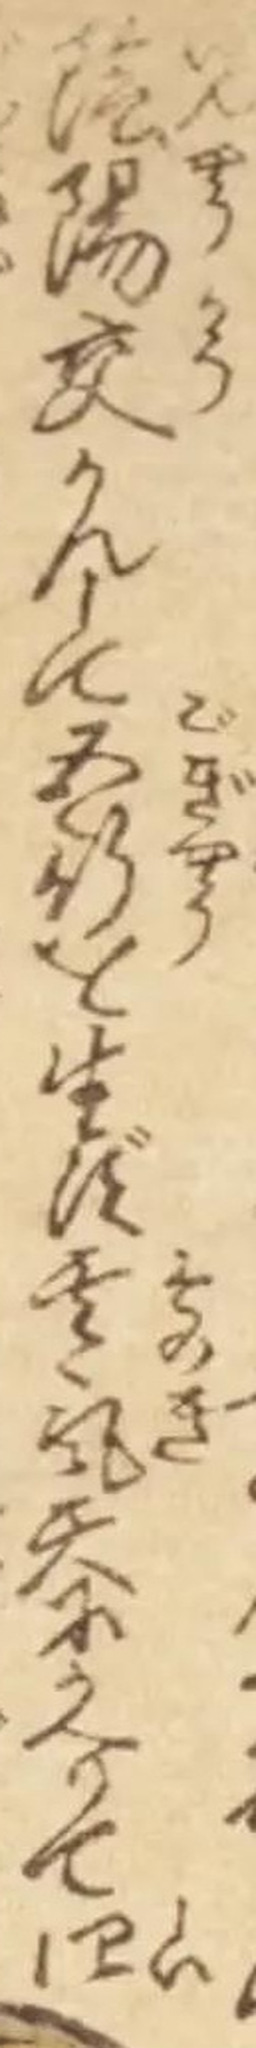陰陽交かんして五行を生ず其気天にかへりて四
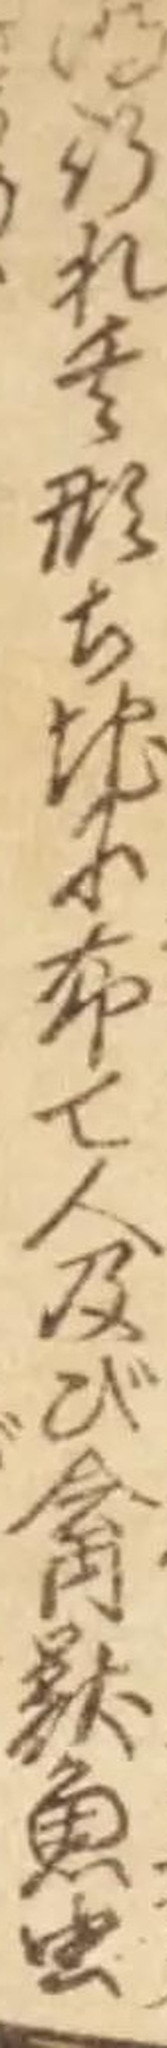時行れ其形ち地に布て人及び禽獣魚虫
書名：地震吉凶之弁
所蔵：国立国会図書館 National Diet Library, JAPAN
